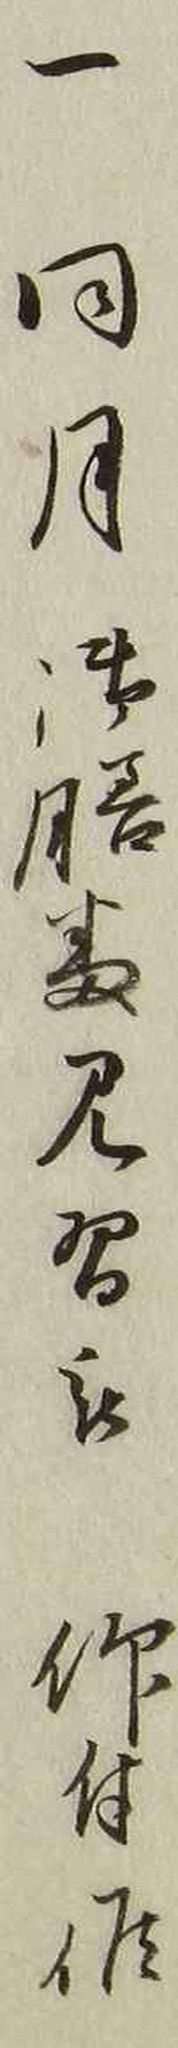一同月御膳番見習被仰付候
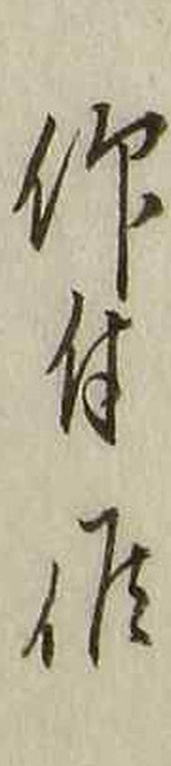仰付候
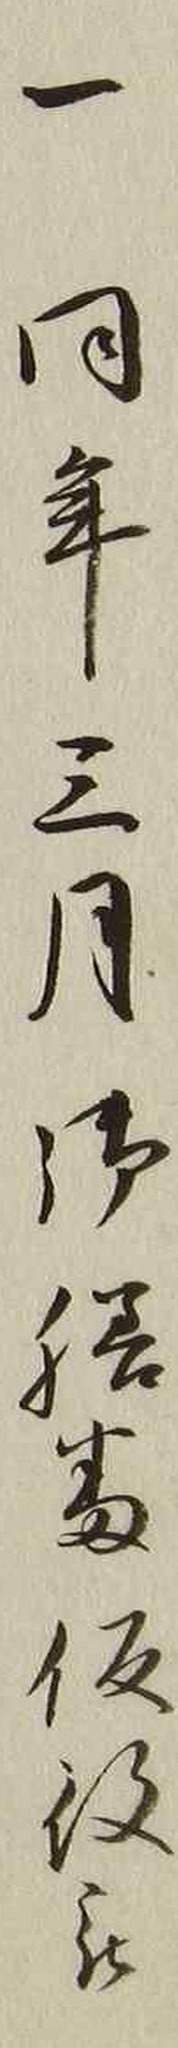一同年三月御膳番仮役被
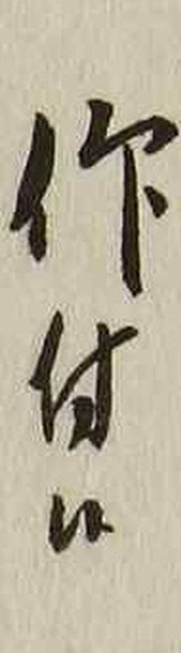仰付候
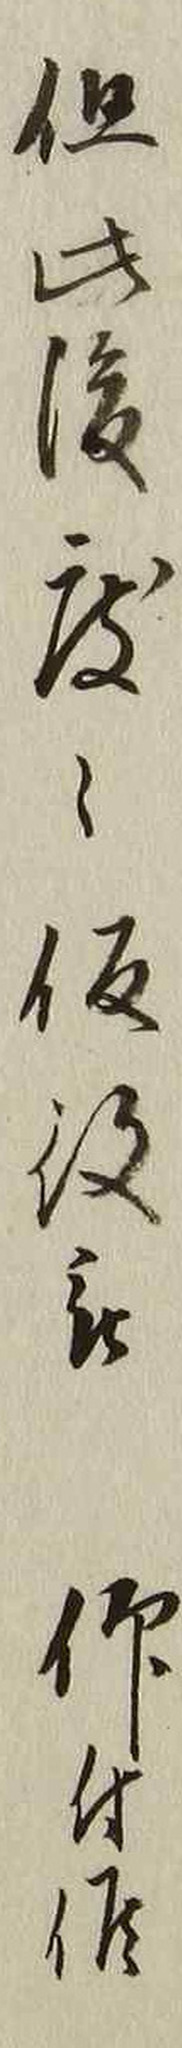但此後度々仮役被仰付候
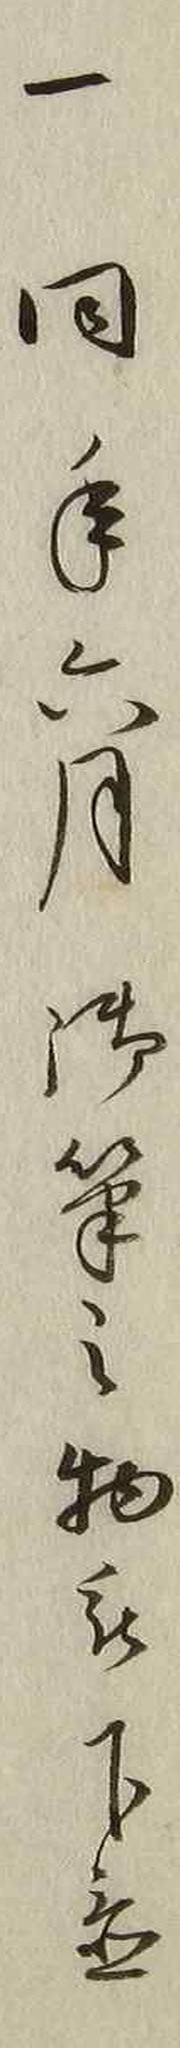一同年六月御筆之物被下置
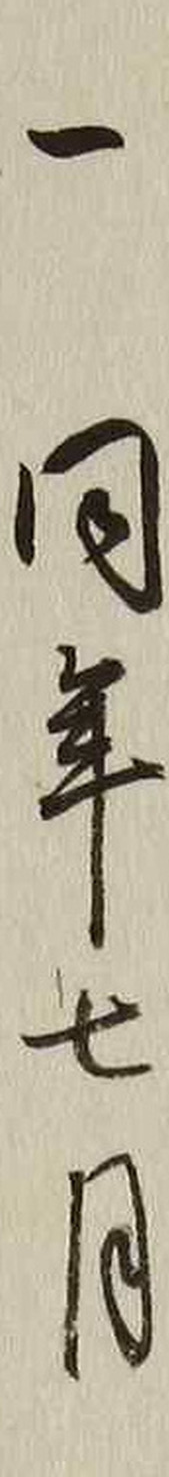一同年七月
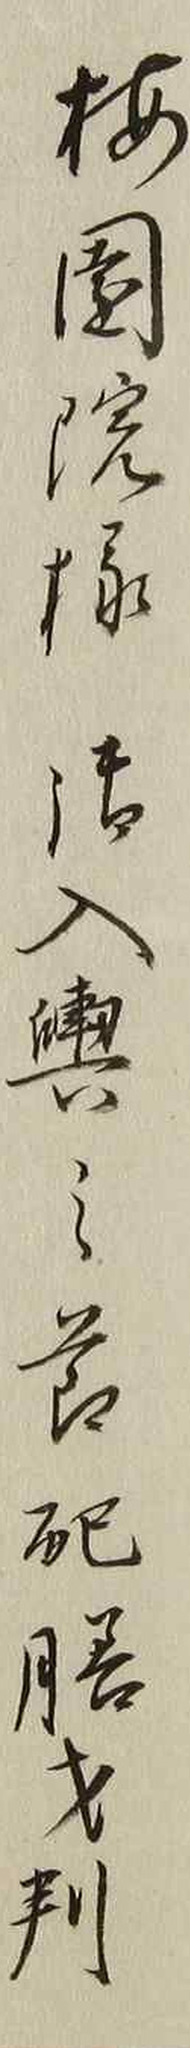梅園院様御入輿之節配膳才判
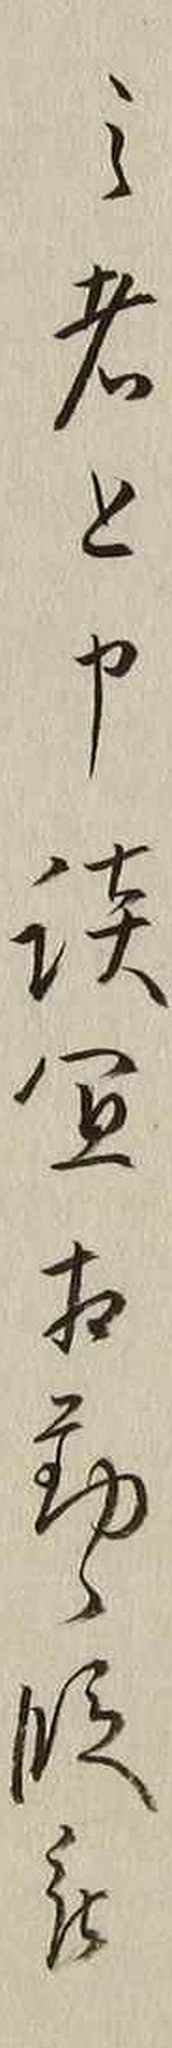之者と申談宜相勤候段被
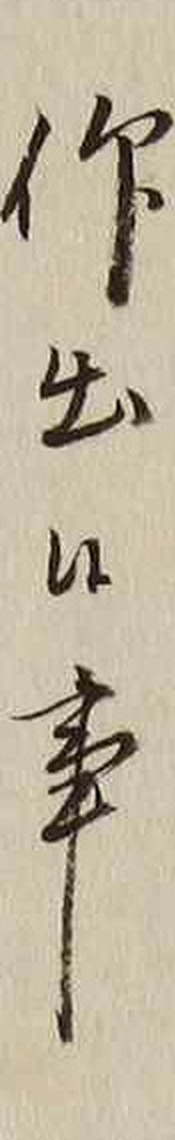仰出候事
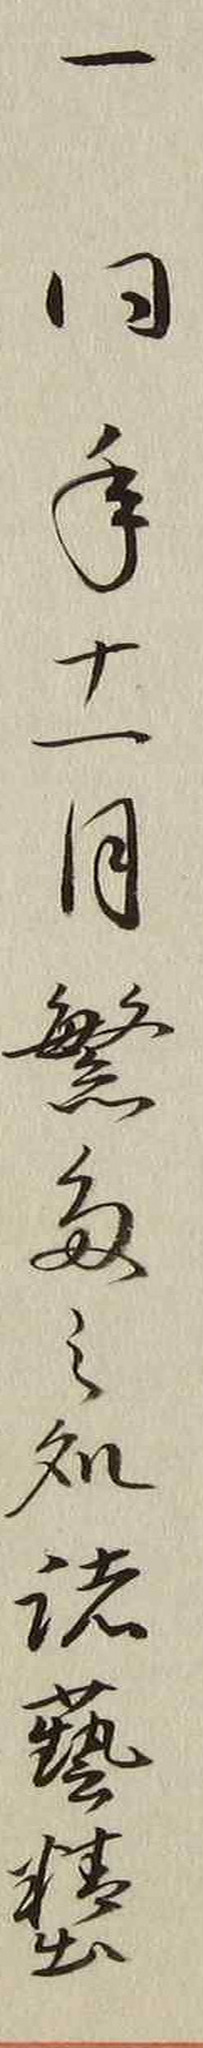一同年十一月繁多之処諸芸精出
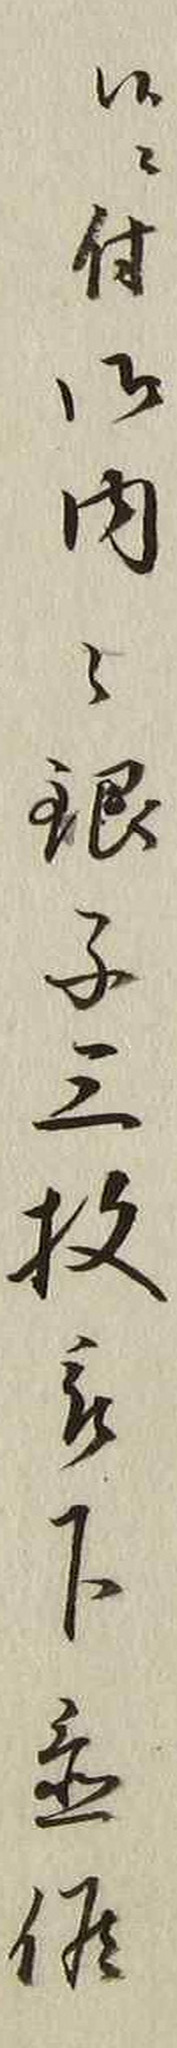候ニ付御内々銀子三枚被下置候
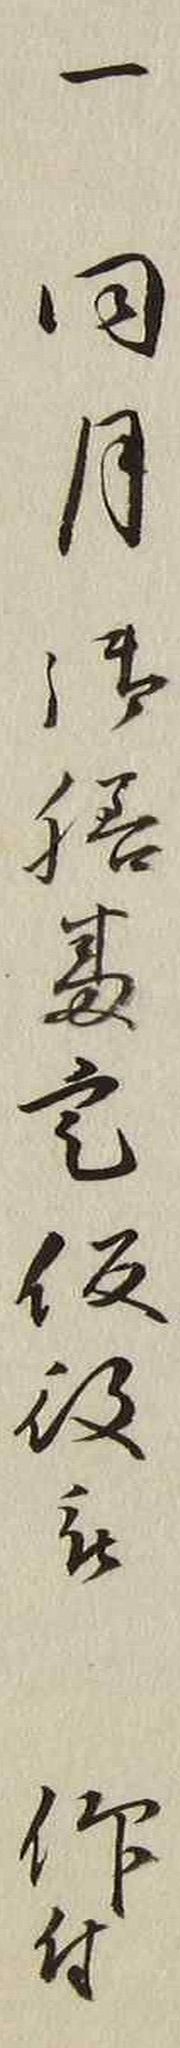一同月御膳番定仮役被仰付
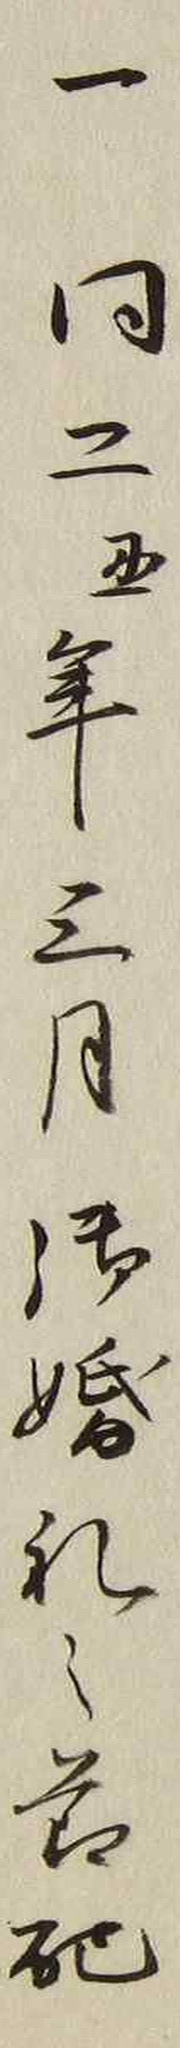一同二丑年三月御婚礼之節配
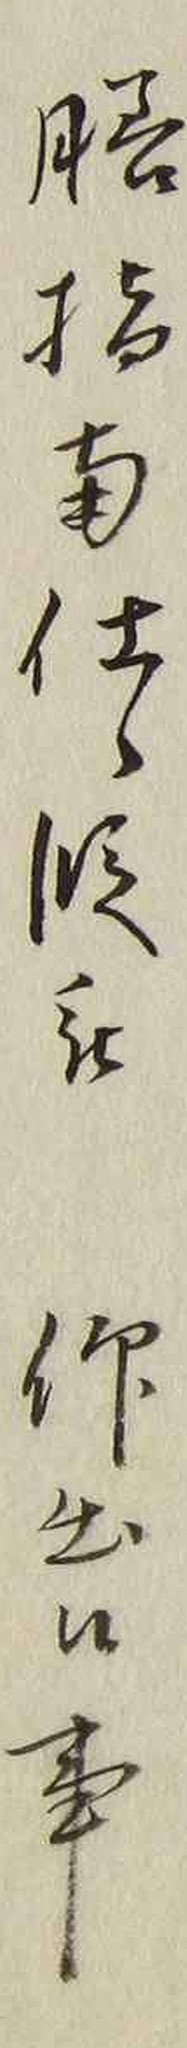膳指南仕候段被仰出候事

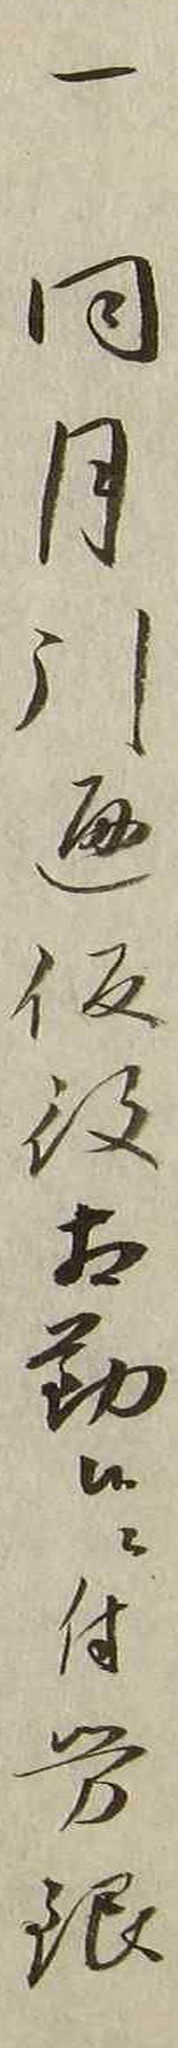一同月引通仮役相勤候ニ付労銀
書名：諸士系譜　巻之22　い之部22
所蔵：会津若松市立会津図書館
